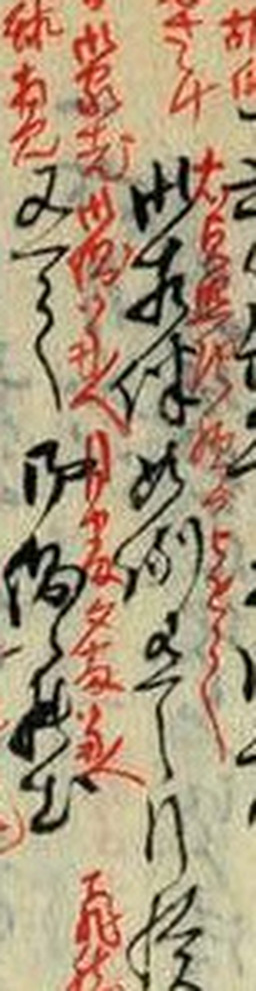有之御側へ罷出
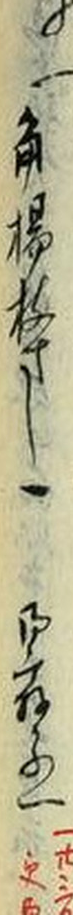角楊枝さし一御扇子一
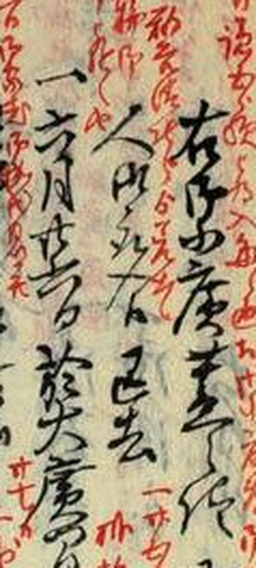人御取合退去
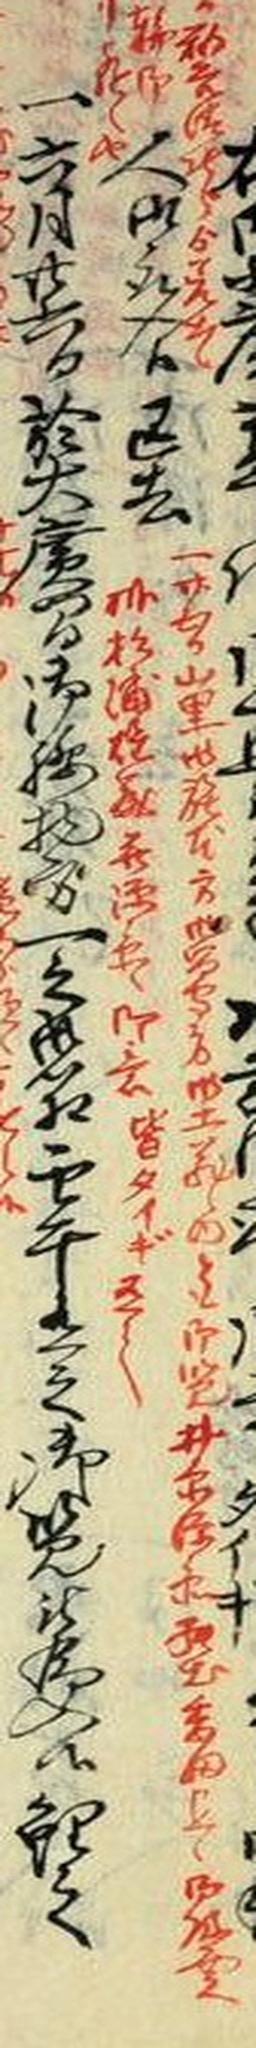一六月廿六日於大広間御腰物方一之御箱虫干有之御覧被為入候鯉之
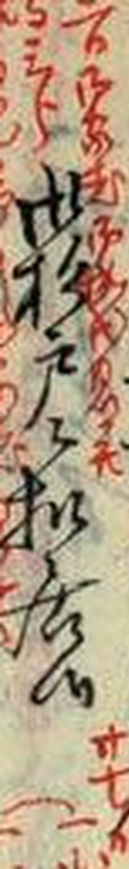御杉戸ニ控居候
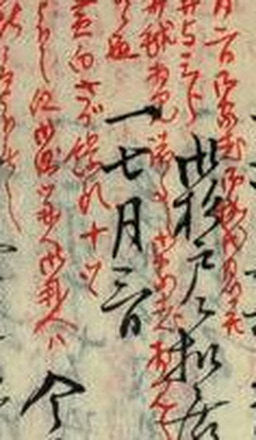一七月三日
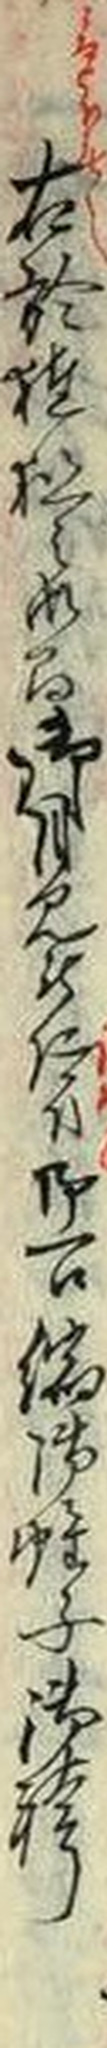右於韃靼之御間御目見被仰付御召縮御帷子御袴
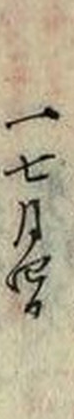一七月四日
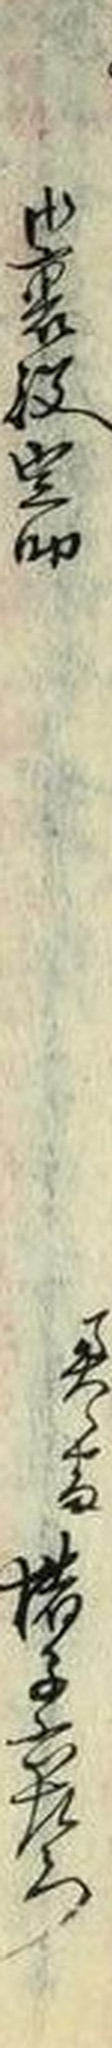御裏役定助奥之番猪子六左衛門
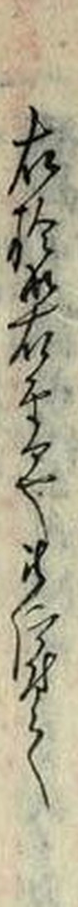右於御右筆部や被仰付之
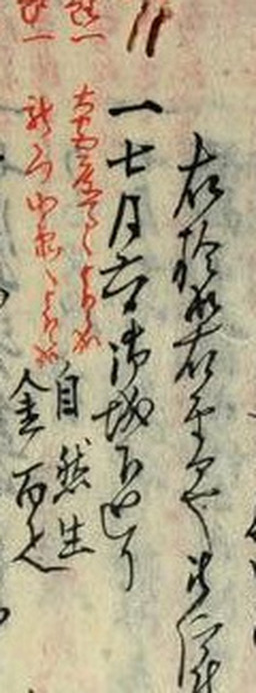一七月六日御城下廻り
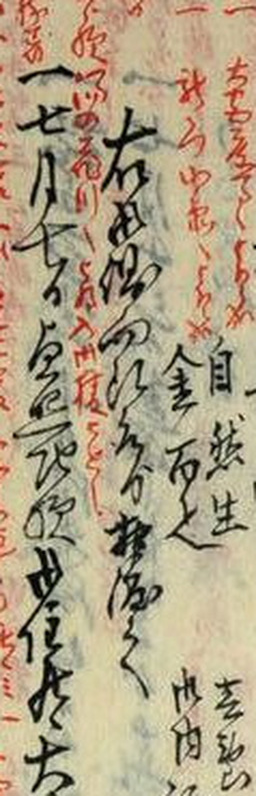右御側向頭取ゟ相渡之
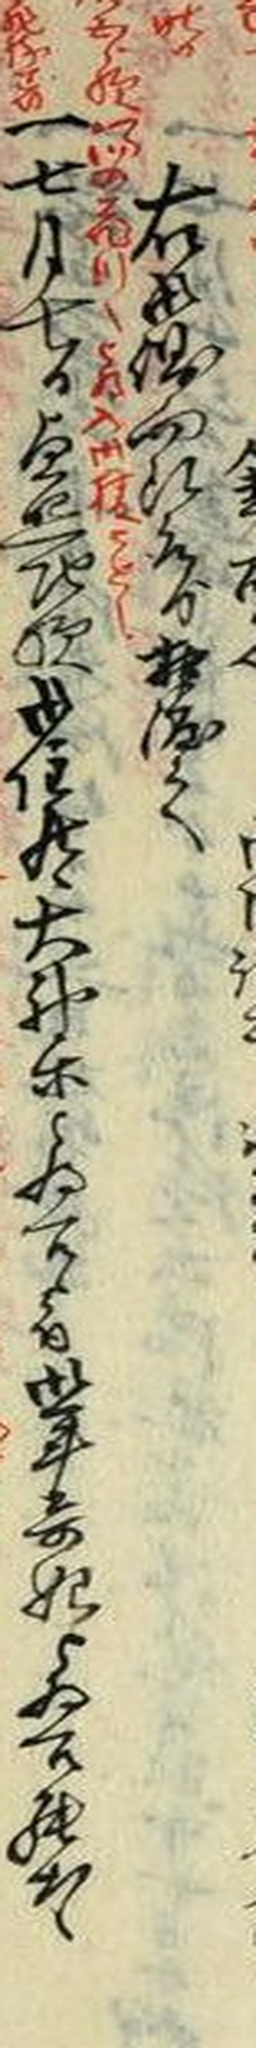一七月七日貞照院様御住居へ大神楽被為召候ニ付御年寄始被為召罷出候

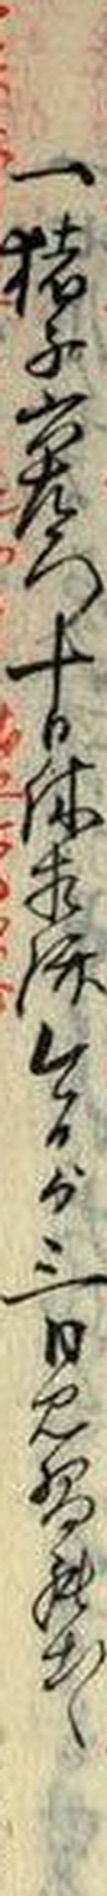一猪子六左衛門十日休相済今日ゟ三日見習罷出候
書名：少傅日録抄（斉承付側向頭取日記、在国）
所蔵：福井県文書館 Fukui Prefectural Archives
